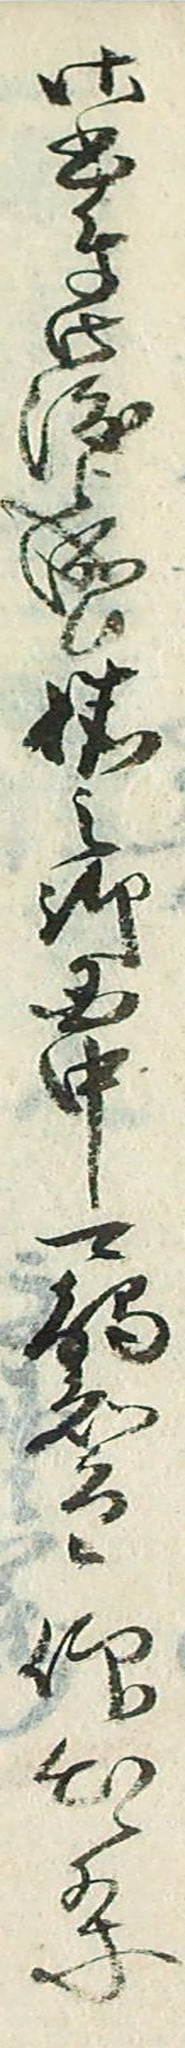御書付御渡被成候依之御国中可触知旨被仰出候条
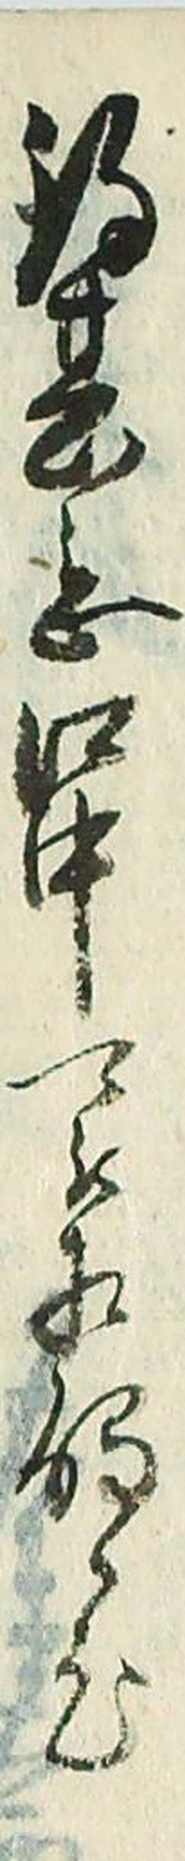得其意郷中可被相触候以上
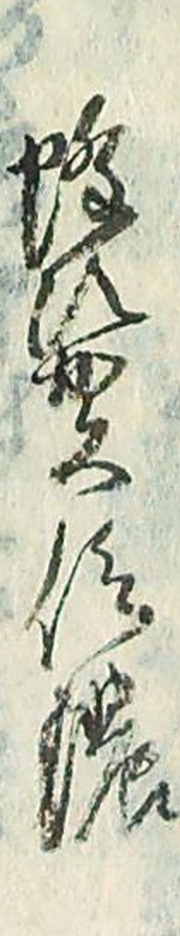蜂須賀信濃
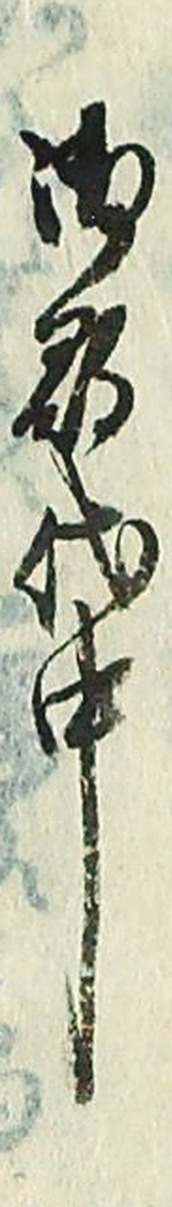御郡代中
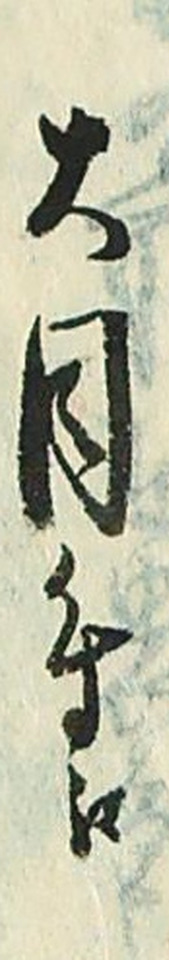大目付江
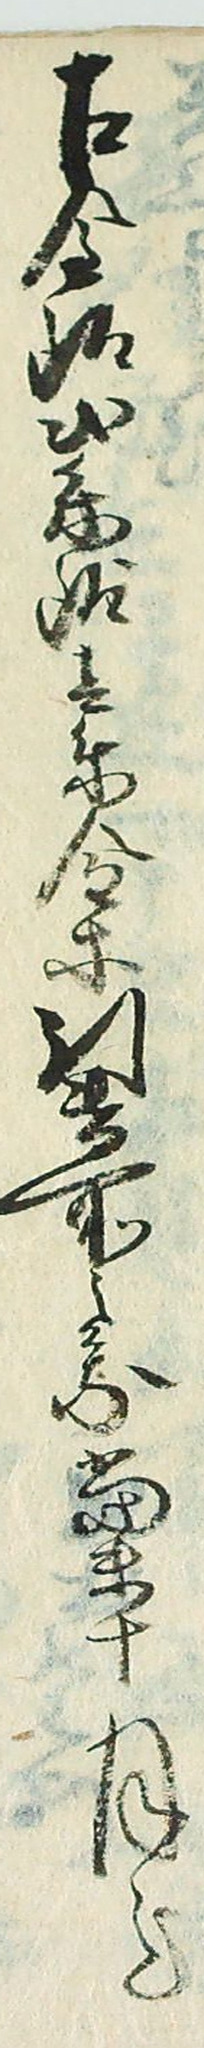古金銀弐朱銀壱朱金等引替所之義当未十月迄
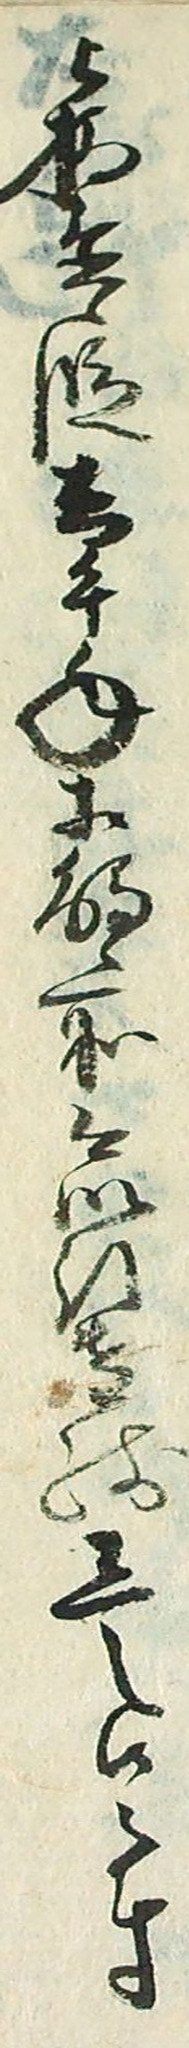被指置候段去午年相触候所今以引替残有之候に付
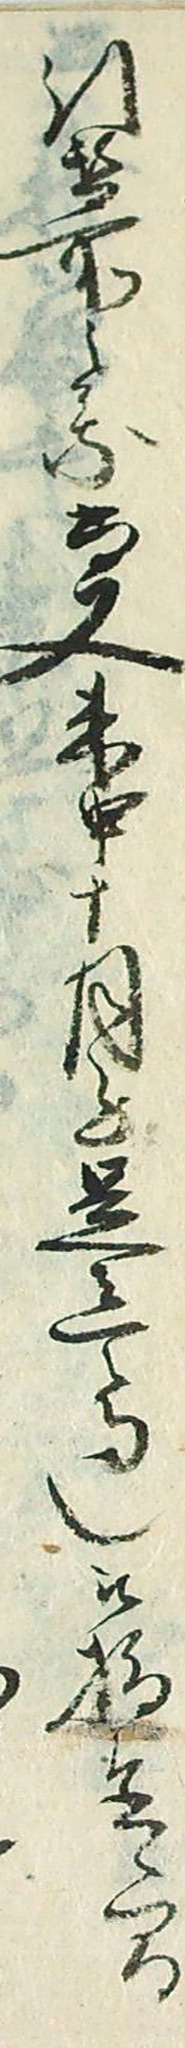引替所之義尚又来申十月迄是迄之通被指置候間
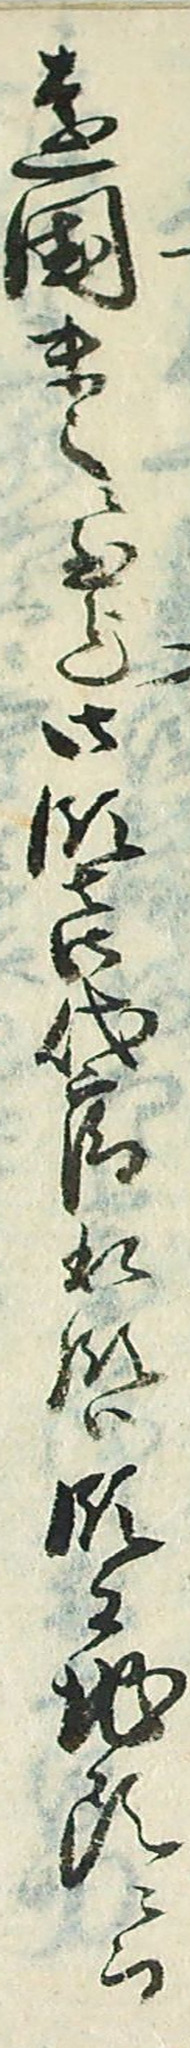遠国末々に至迄御領は御代官私領は領主地頭に而
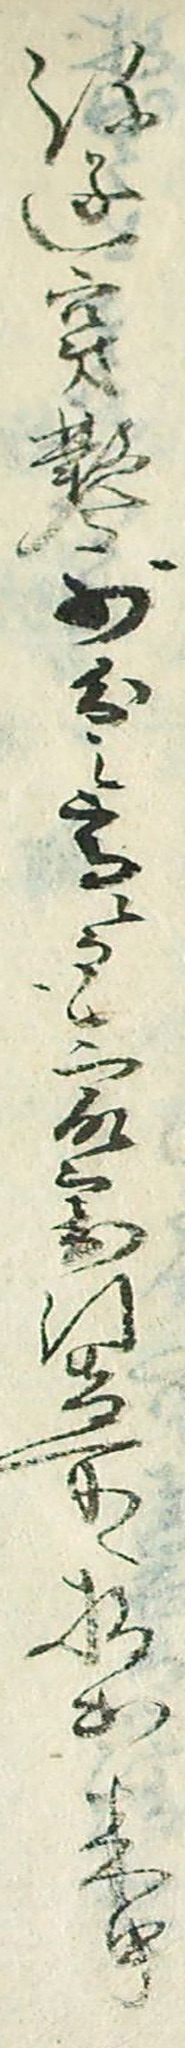弥遂穿鑿少分之高に而も最寄引替所へ指出来申
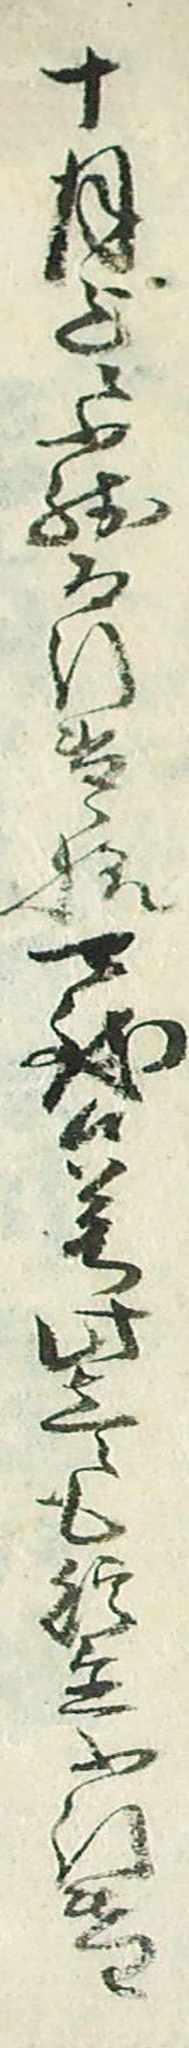十月迄に不残為引替候様可致候若此上にも貯置
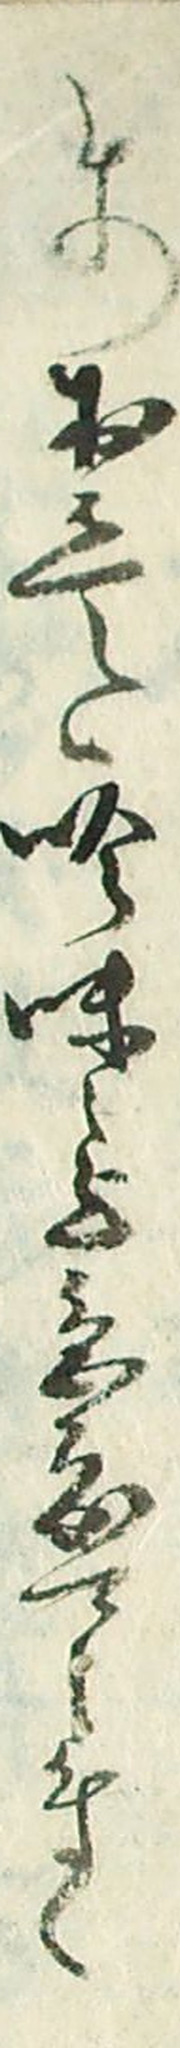もの於有之は吟味之上急度可申付候
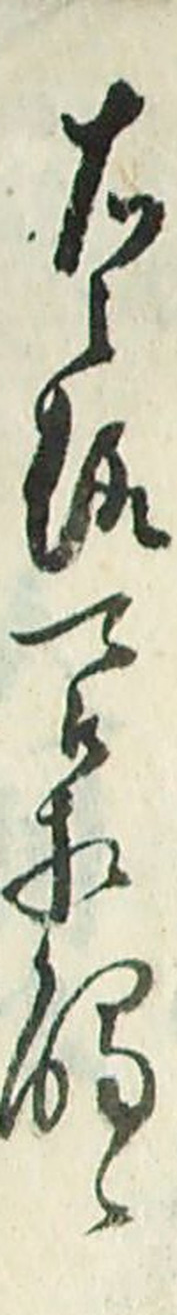右之趣可被相触候

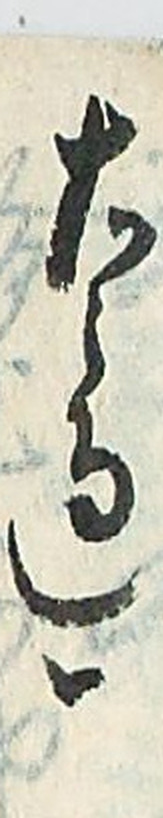右之通
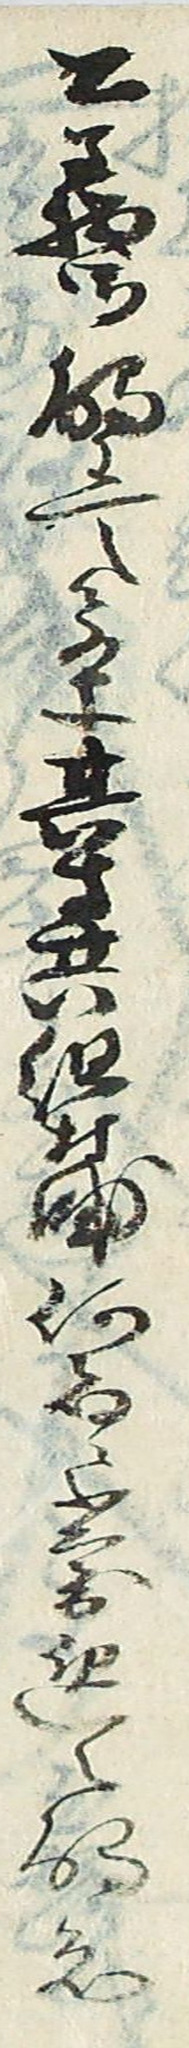公義御触有之候条其方共組村浦何者に不寄逸々触知
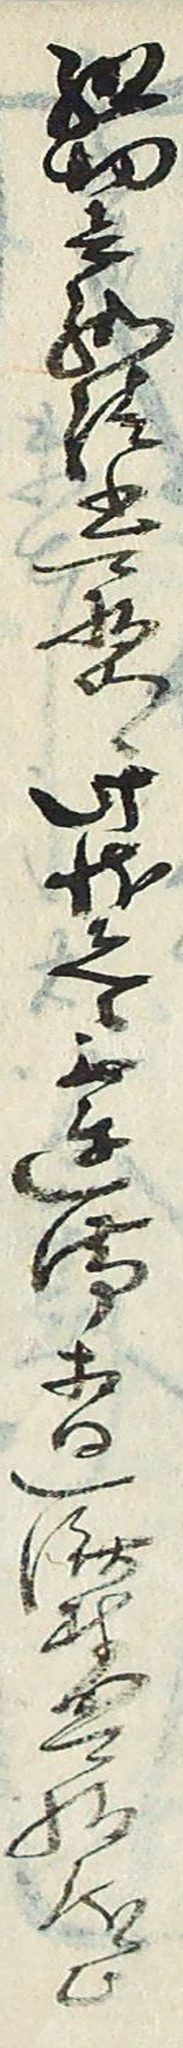組切壱紙請書可指出候此状先々無遅滞相廻済村ゟ可指戻候以上
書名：諸御用御□受書控
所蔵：鳴門教育大学 Naruto University of Education
